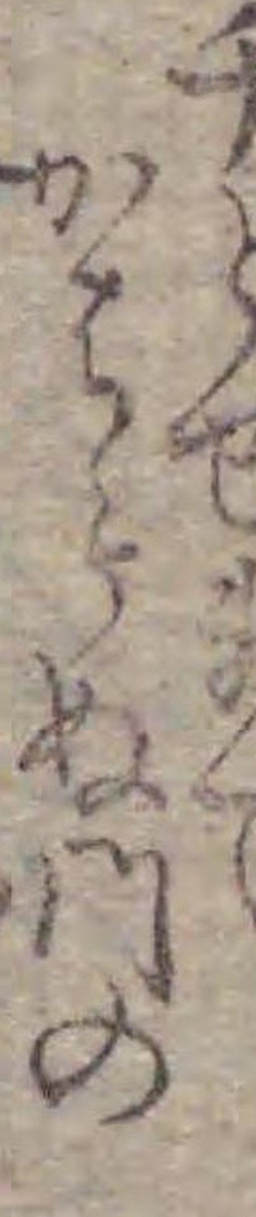かはらぬ門の
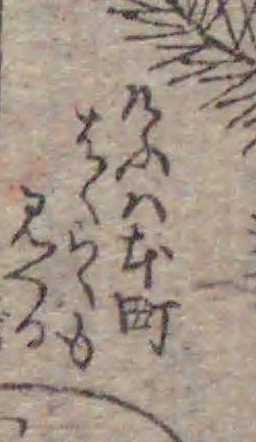けふは本町
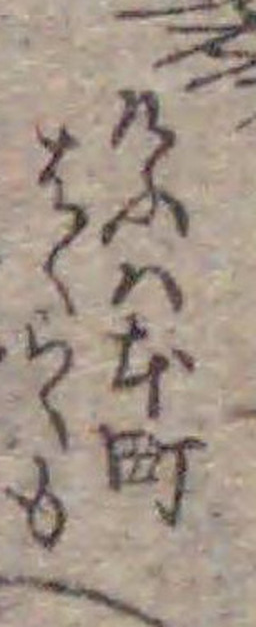はくらくも
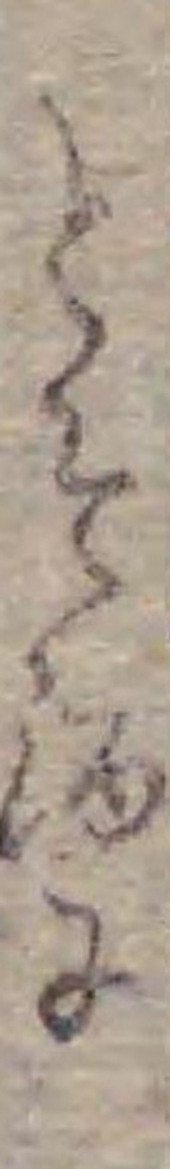とそ酒に
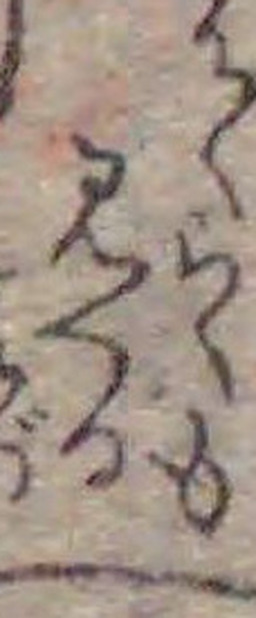見へる
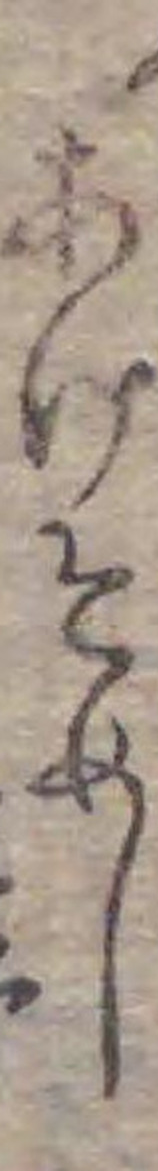あけそめし
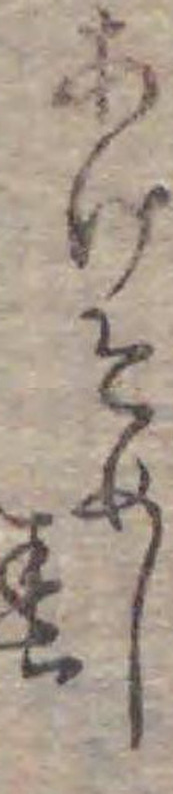あけそめし
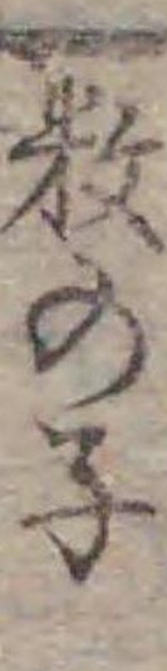数の子
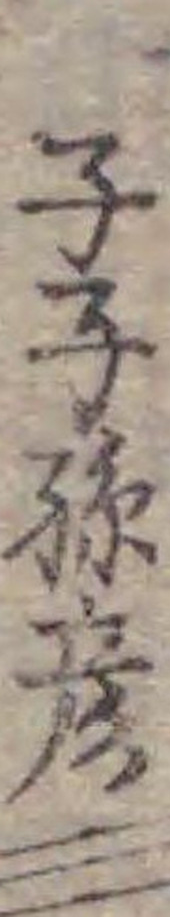子子孫彦
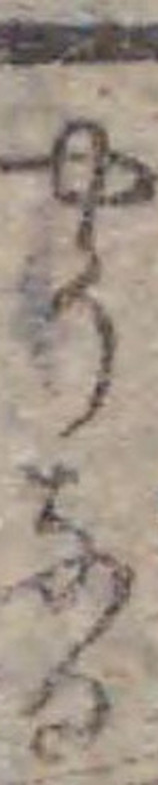やうなる
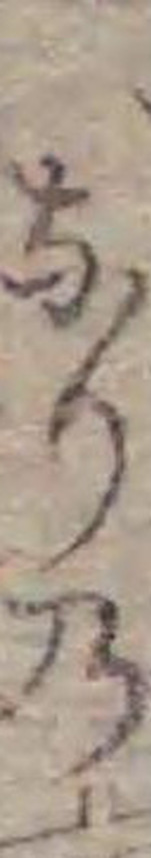なりの
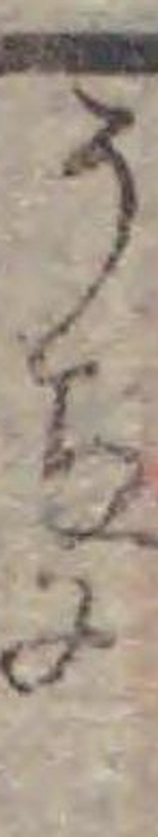うちに
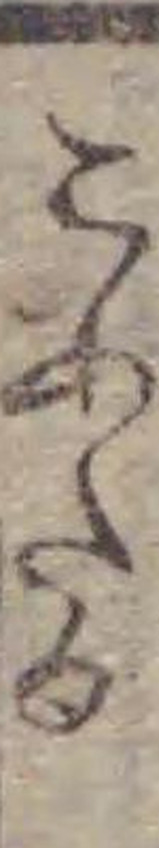こめたる
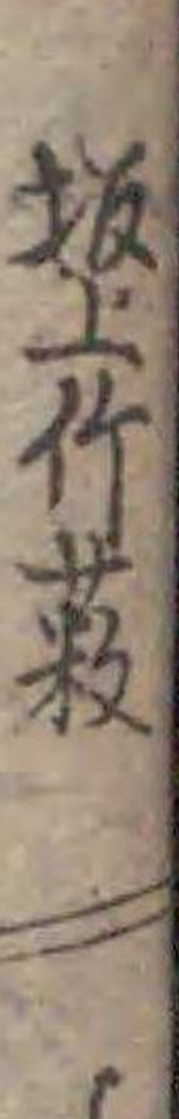坂上竹薮
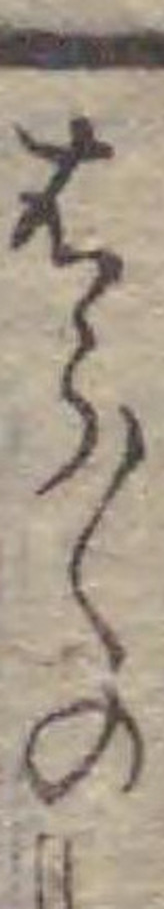はら〳〵の
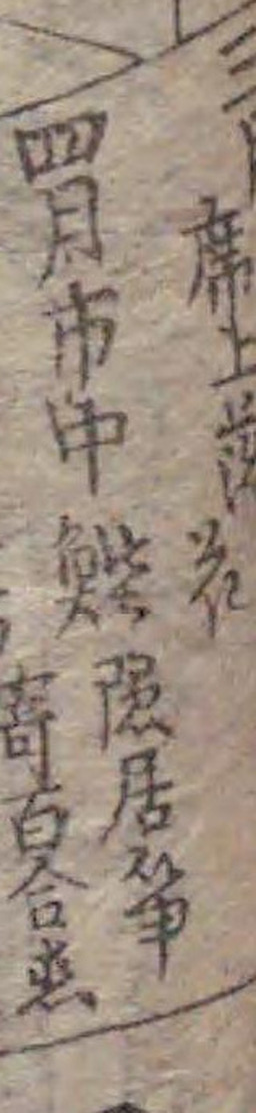四月市中鰹隠居筝
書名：年始御礼帳 : 3巻
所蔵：国立国会図書館 National Diet Library, JAPAN
